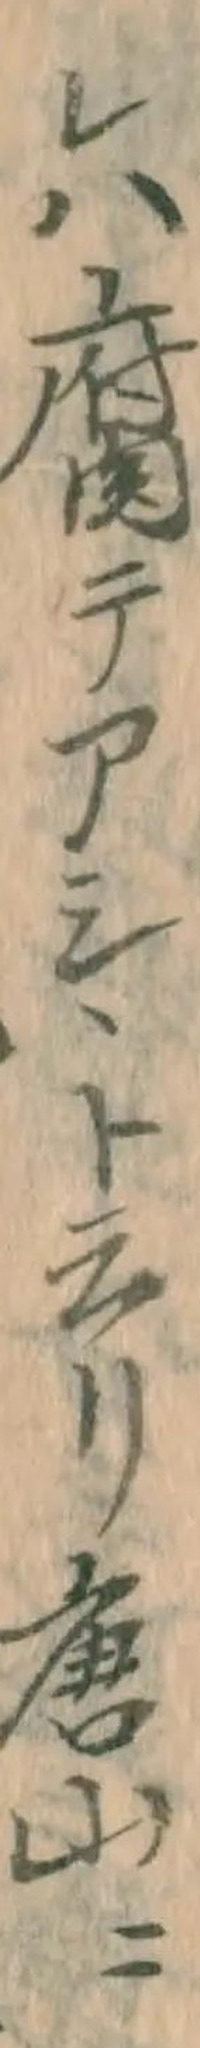レハ腐テアシヽト云リ唐山ニ
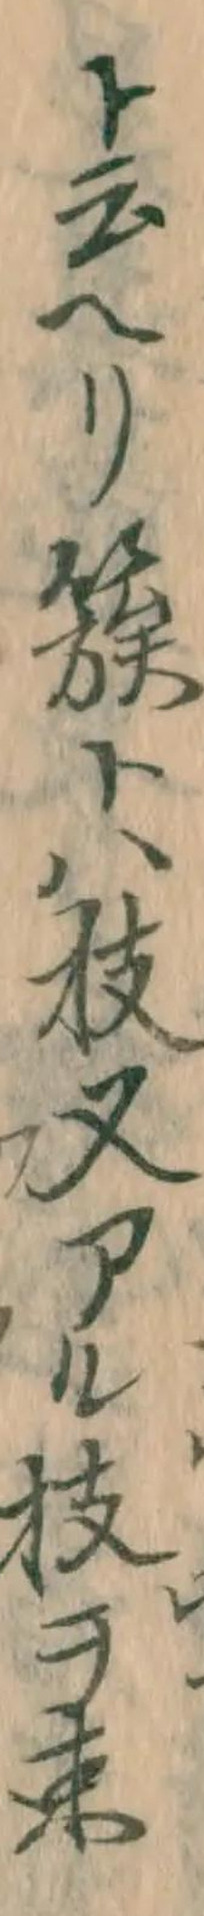ト云ヘリ蔟トハ枝又アル枝ヲ束
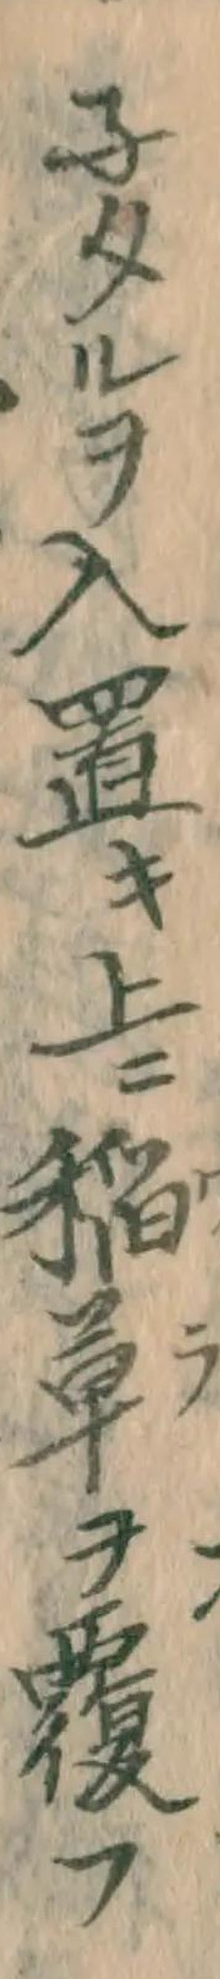ネタルヲ入置キ上ニ稲草ヲ覆フ
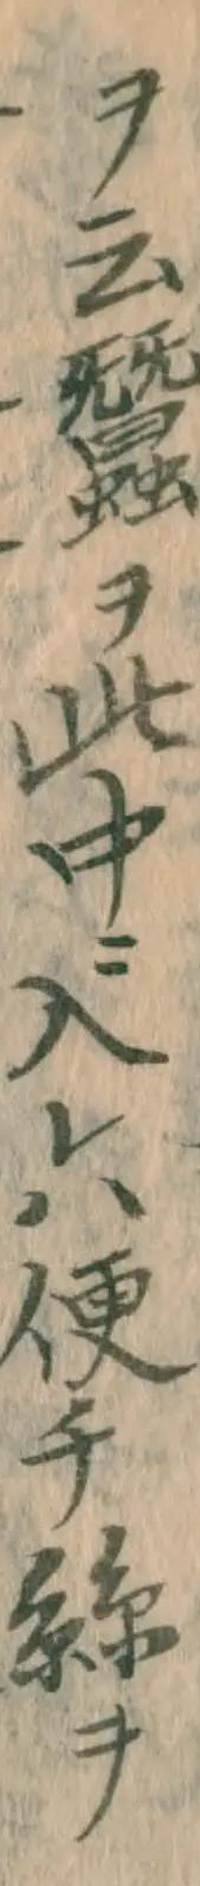ヲ云蠶ヲ此中ニ入レハ便チ絲ヲ
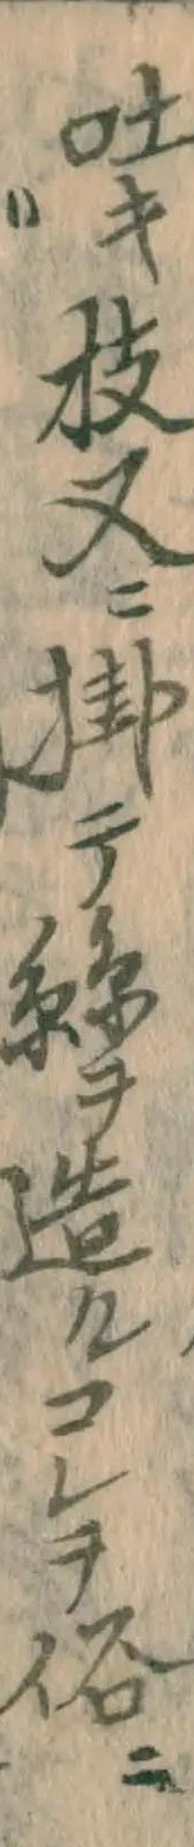吐キ枝又ニ掛テ絲ヲ造ルコレヲ俗ニ
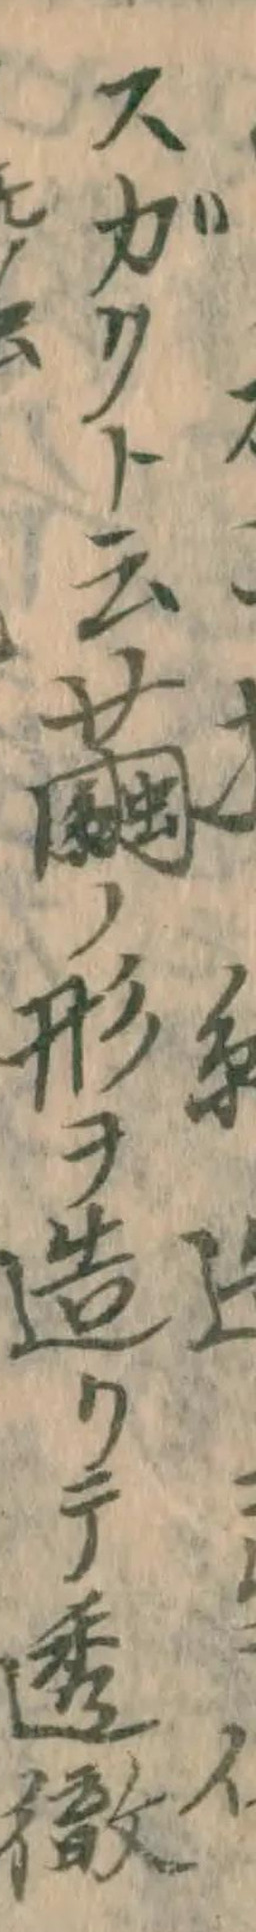スガクト云繭ノ形ヲ造リテ透徹
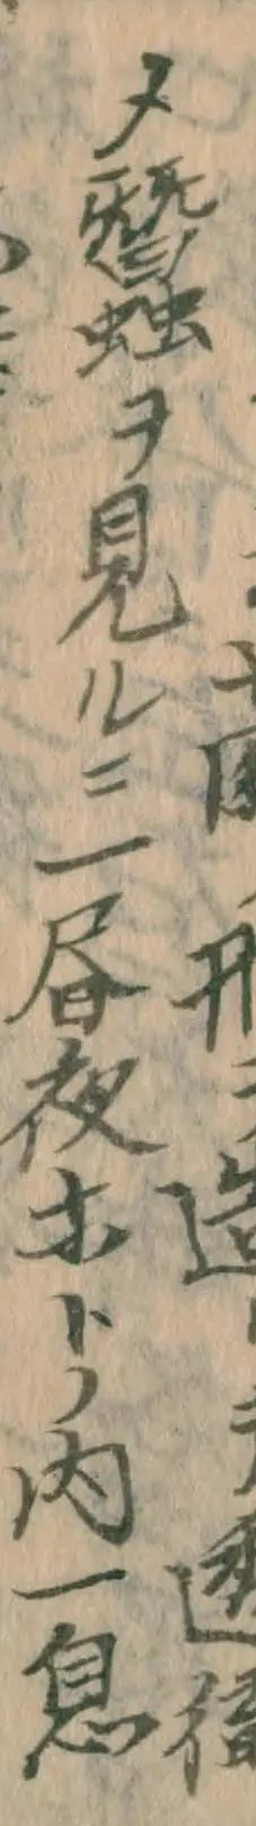シテ蠶ヲ見ルニ一昼夜ホトノ内一息
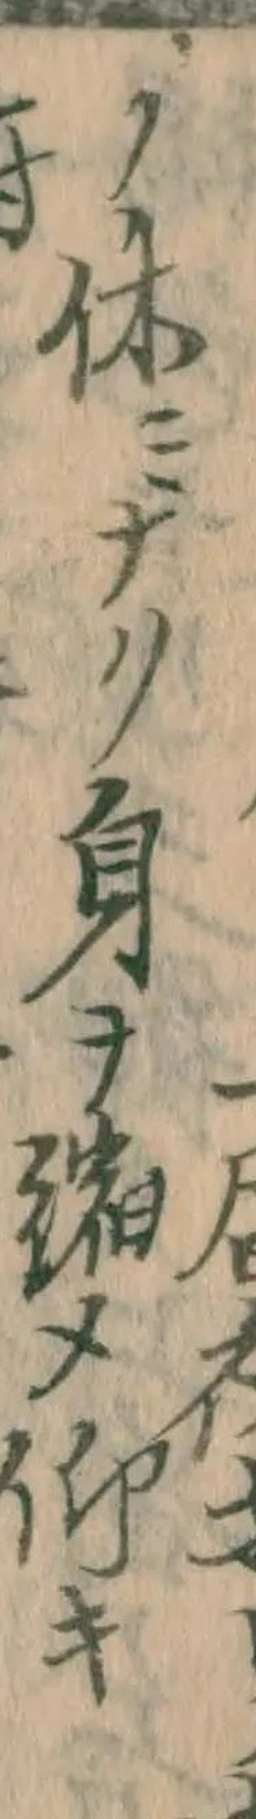ノ休ミナク身ヲ縮メ仰キ
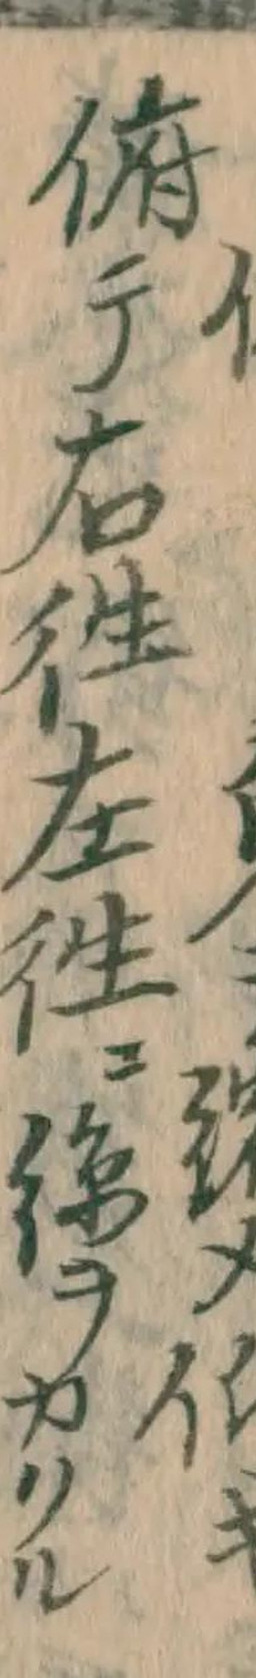俯テ右往左往ニ絲ヲカクル
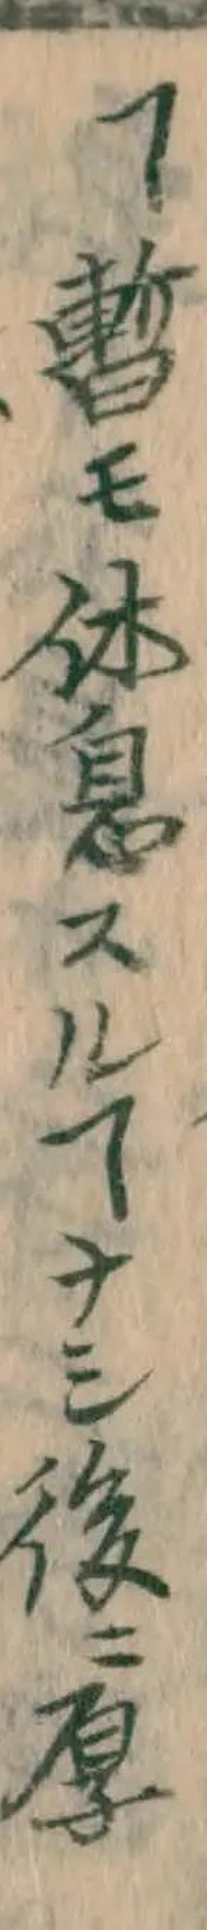コト暫モ休息スルコトナシ後ニ厚
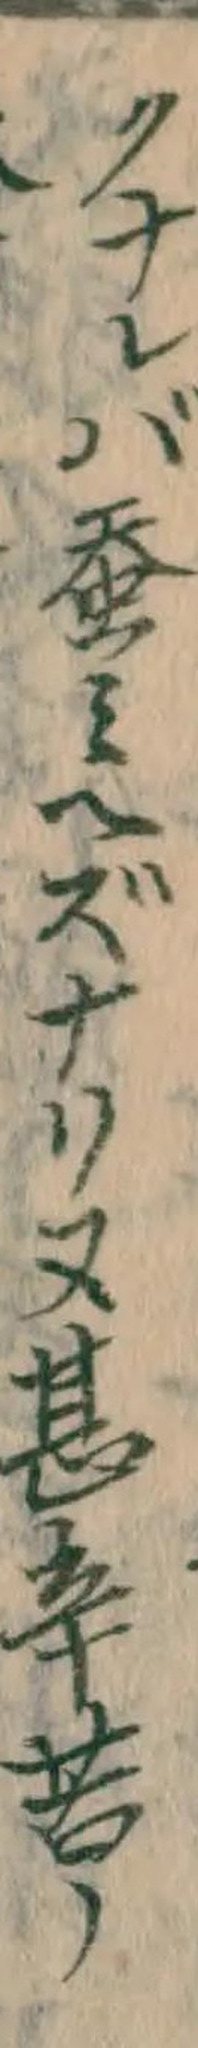クナレバ蚕ミヘズナリヌ甚辛苦ノ
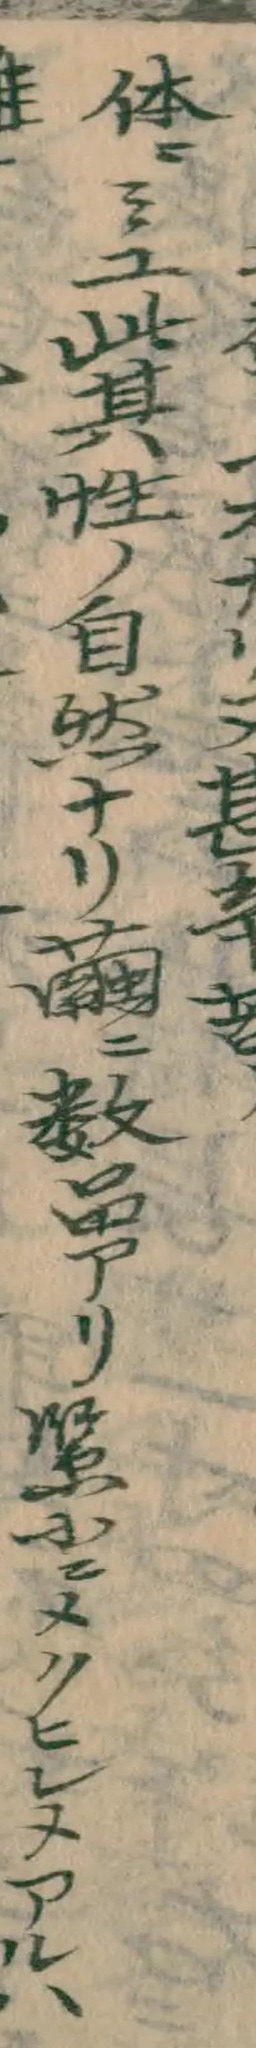体ニミユ此其性ノ自然ナリ繭ニ数品アリ緊小ニシテクヒレメアルハ
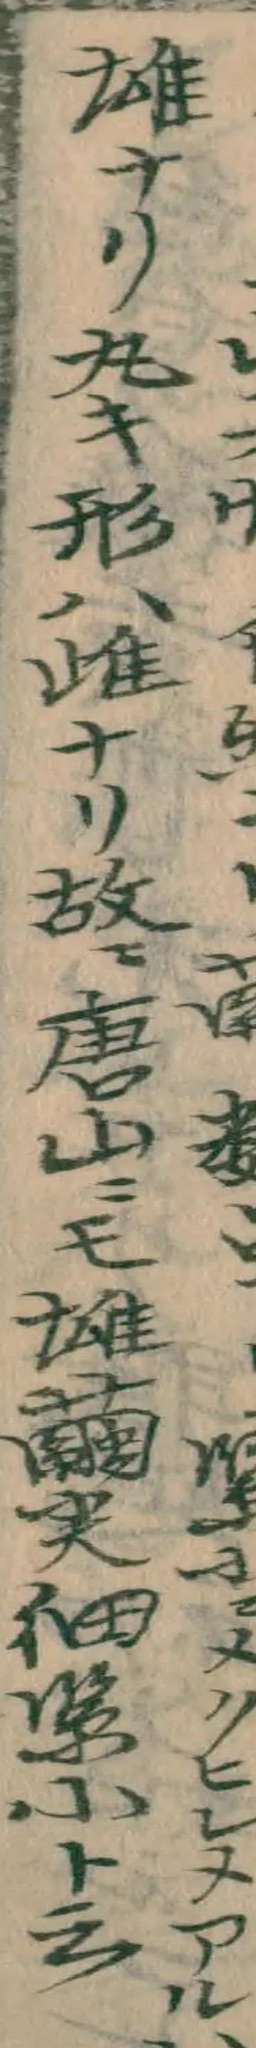雄ナリ丸キ形ハ雌ナリ故ニ唐山ニモ雄繭尖細緊小ト云
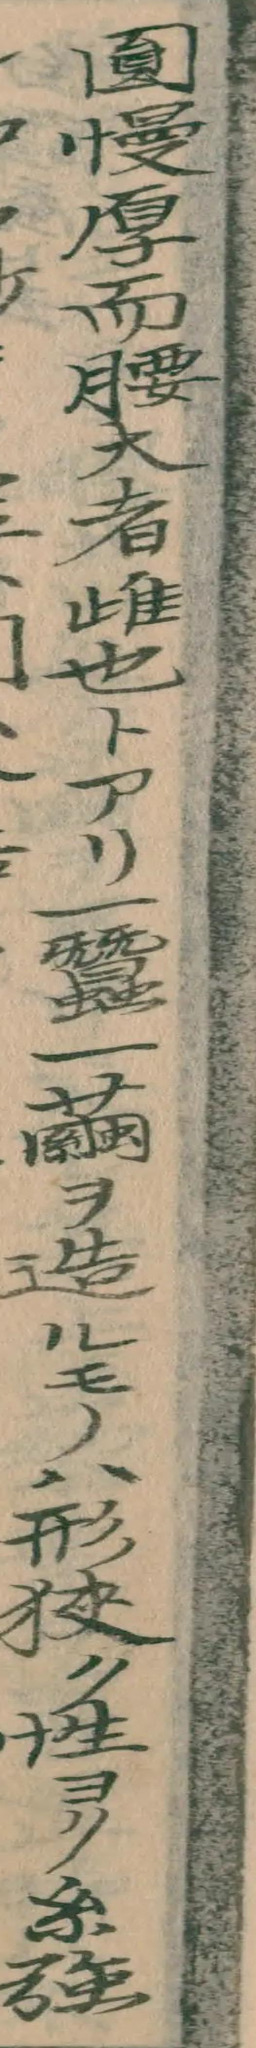圓慢厚而腰大者雌也トアリ一蠶一繭ヲ造ルモノハ形狭ク性ヨク糸強
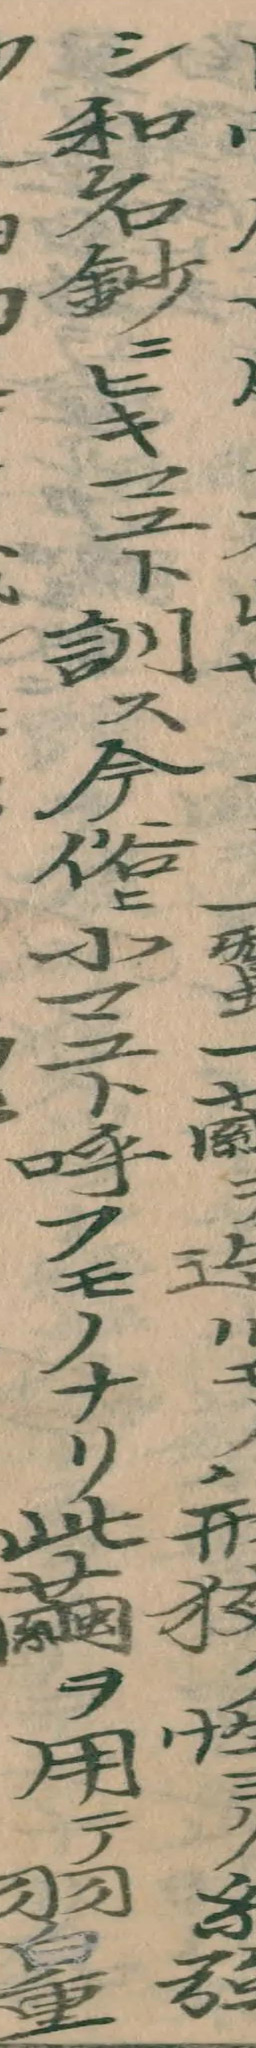シ和名鈔ニヒキマユト訓ス今俗ニ小マユト呼フモノナリ此繭ヲ用テ羽白重
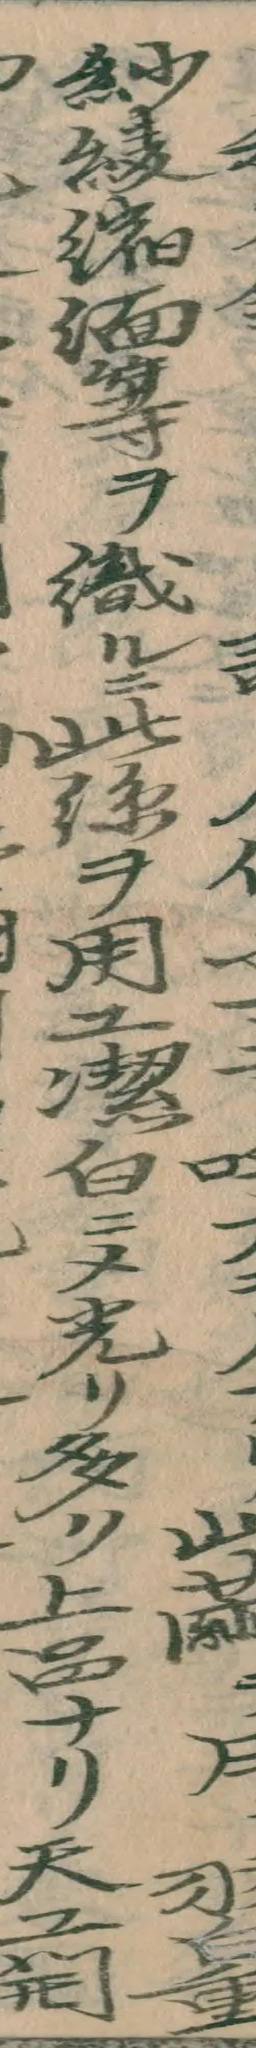紗綾縮緬等ヲ織ルニ此絲ヲ用ユ潔白ニシテ光リ多ク上品ナリ天工開
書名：千蟲譜 3巻. [1]
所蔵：国立国会図書館 National Diet Library, JAPAN
